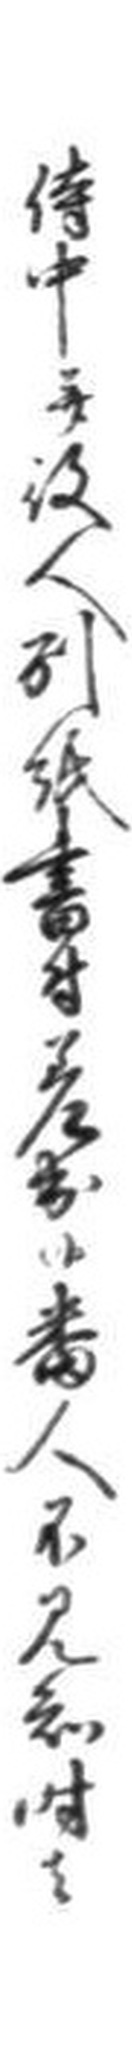侍中并役人別紙書付差出候番人不見知時者
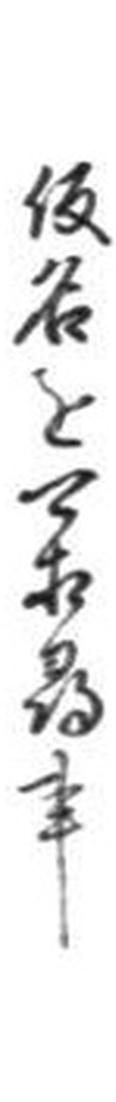仮名を可相尋事
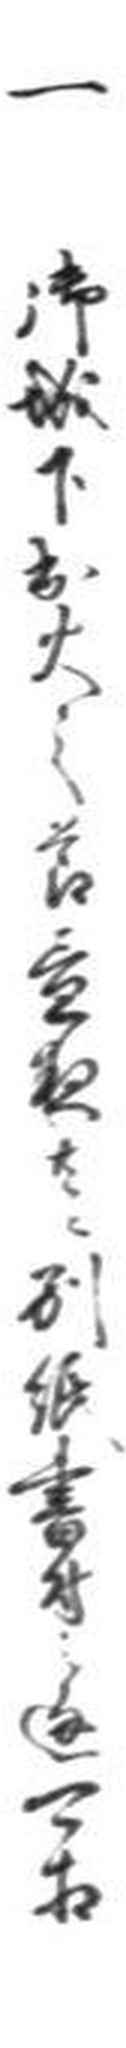一御城下出火之節昼夜共ニ別紙書付之通可相
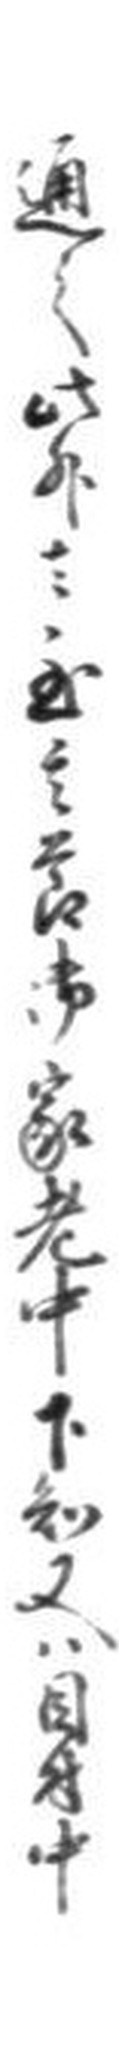通之此外者至其節御家老中下知又ハ目付中
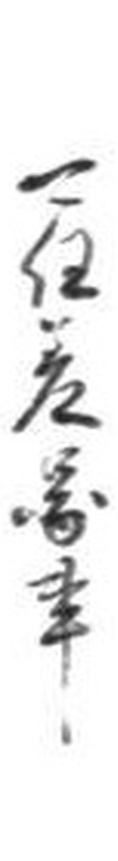可任差図事
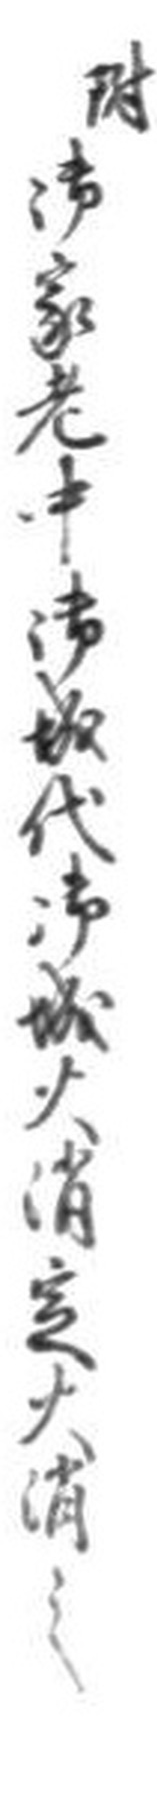御家老中御城代御城火消定火消之
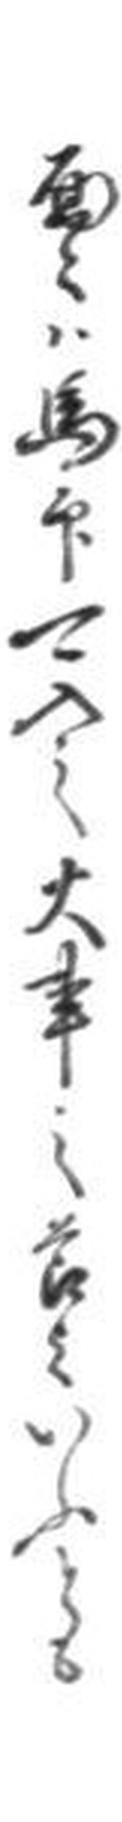面々ハ馬印可入之火事之節与いふとも
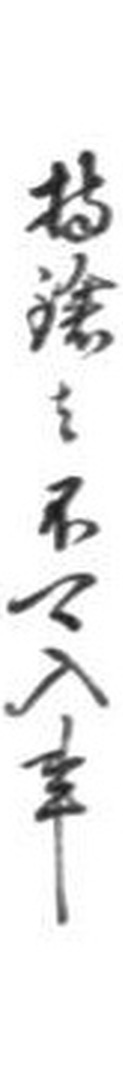持鎗者不可入事
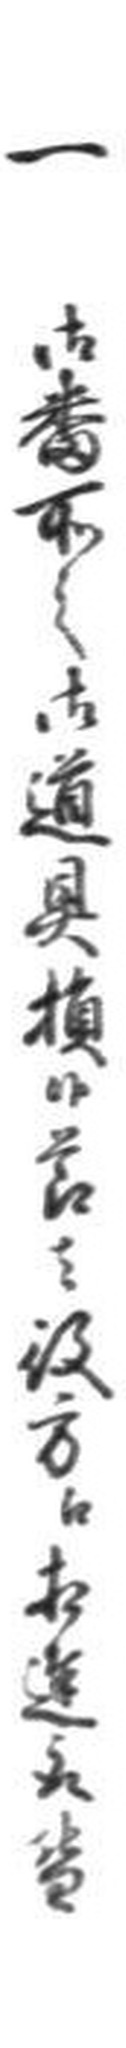一御番所之御道具損候節者役方江相達取替

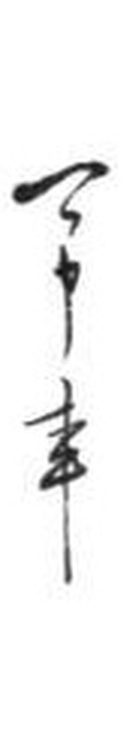可申事
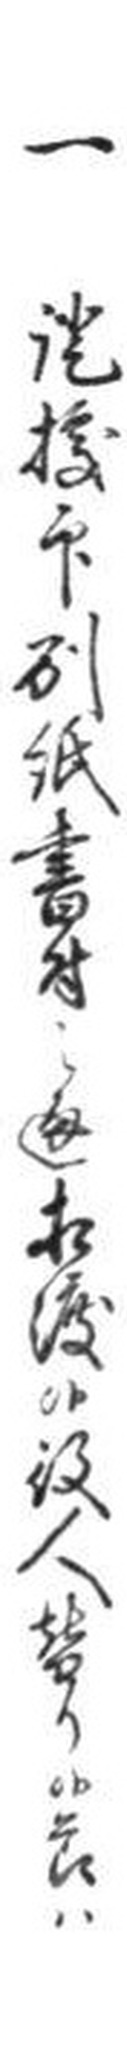一証拠印別紙書付之通相渡候役人替り候節ハ
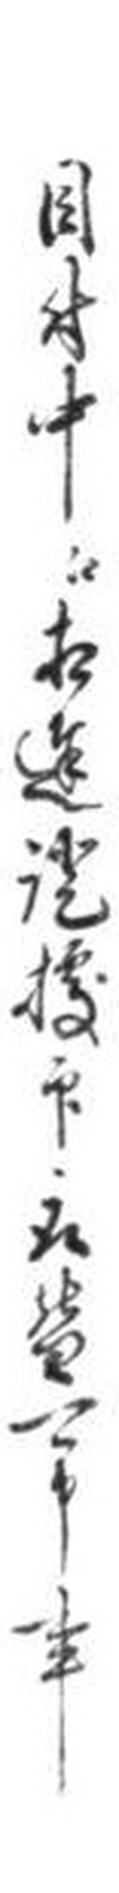目付中江相達証拠印取替可申事
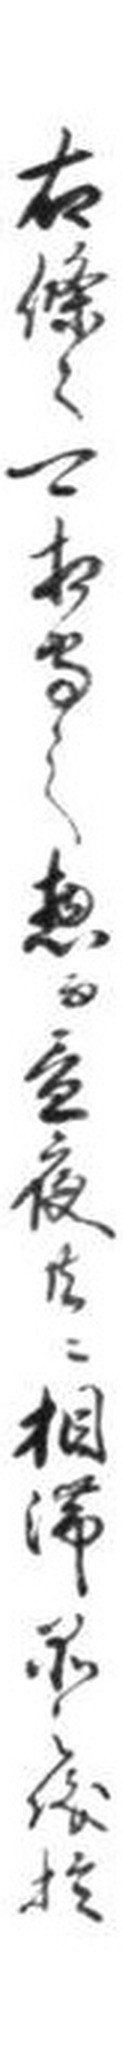右条々可相守之惣而昼夜共ニ相滞品之儀於
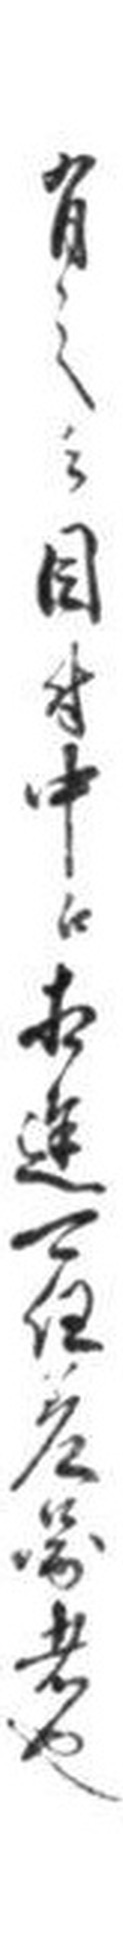有之者目付中江相達可任差図者也
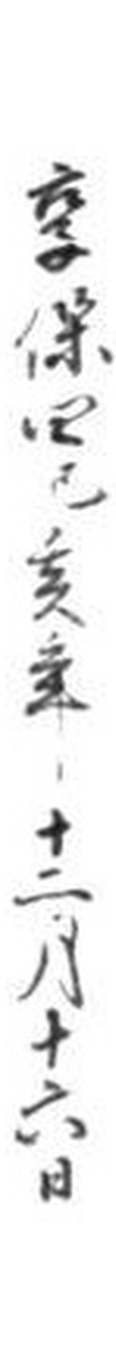享保四己亥年十二月十六日
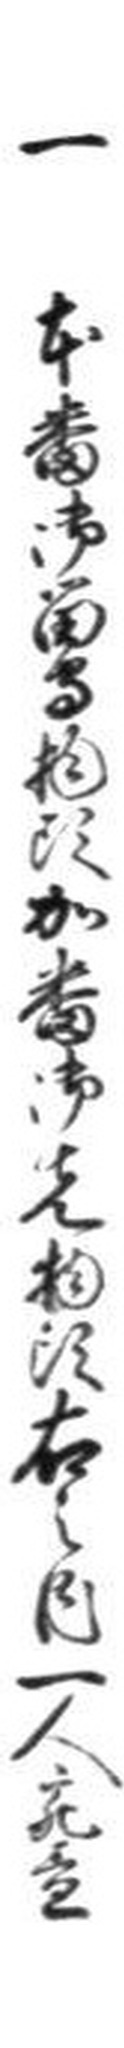一本番御留守物頭加番御先物頭右之内一人宛昼
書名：家譜 三十三 吉邦公 享保四年
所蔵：福井県文書館 Fukui Prefectural Archives
